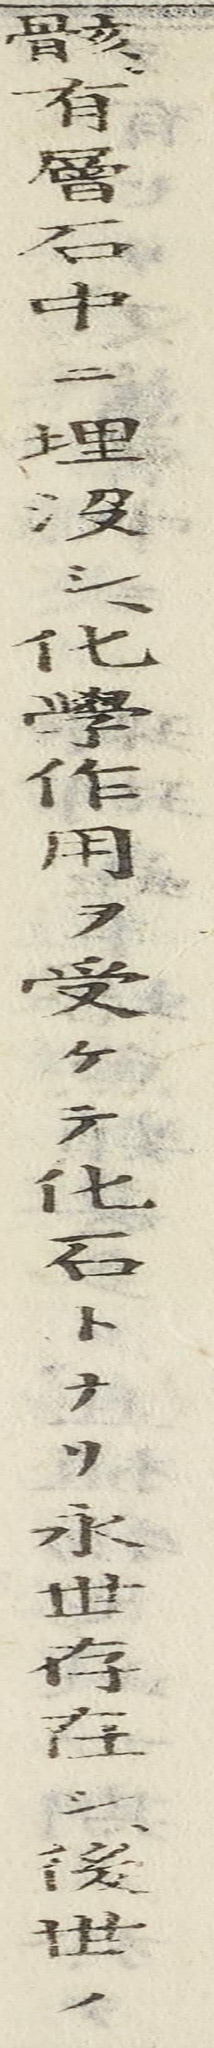骸、有層石中ニ埋没シ、化学作用ヲ受ケテ化石トナリ永世存在シ、後世ノ
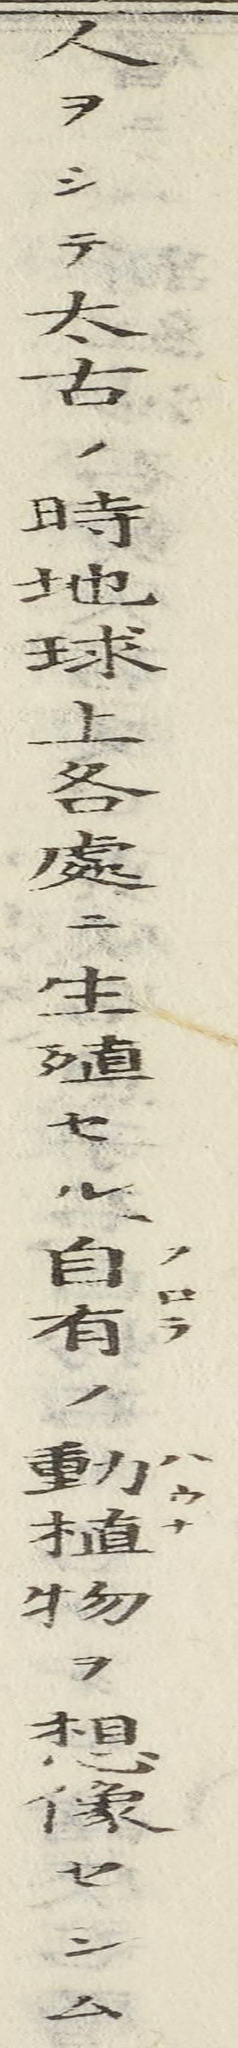人ヲシテ太古ノ時地球上各処ニ生殖セル、自有ノ動植物ヲ想像セシム
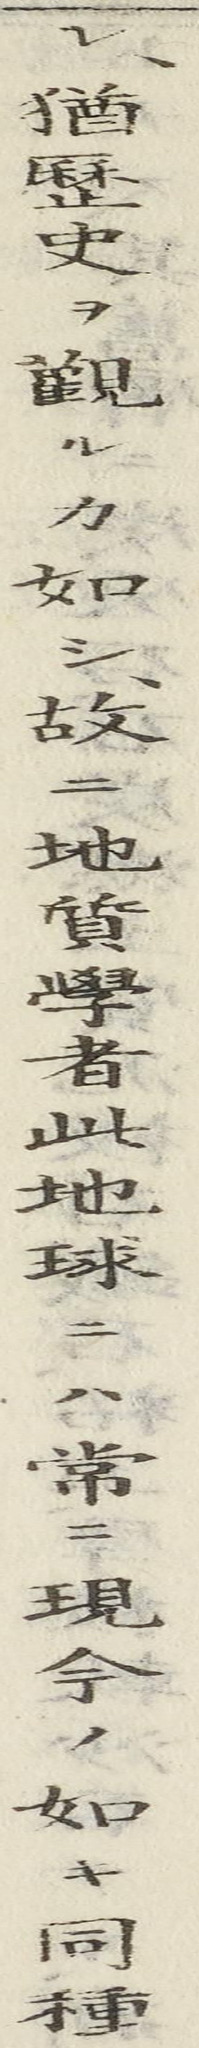レ、猶歴史ヲ観ルカ如シ、故ニ地質学者此地球ニハ常ニ現今ノ如キ同種
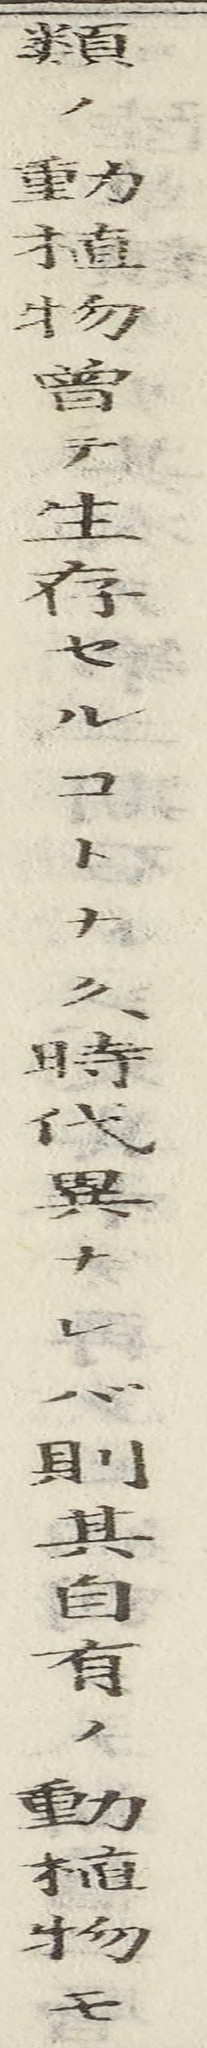類ノ動植物曾テ生存セルコトナク、時代異ナレバ則其自有ノ動植物モ
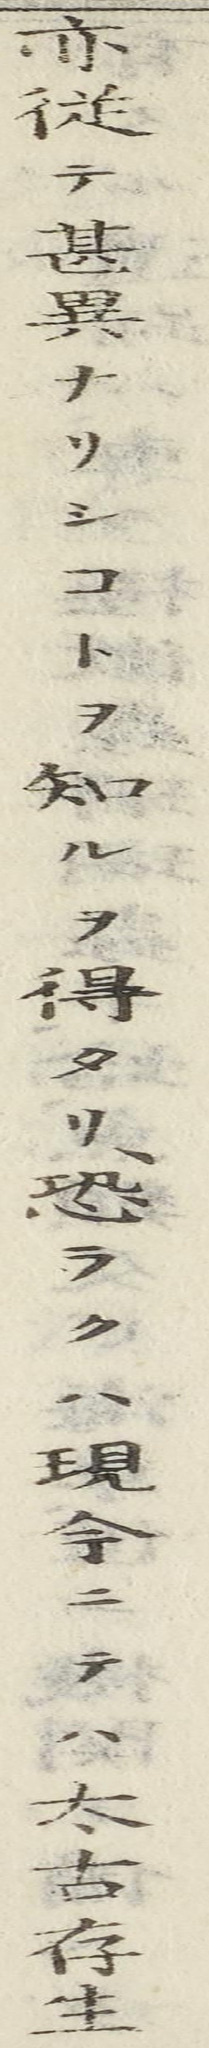亦従テ甚異ナリシコトヲ知ルヲ得タリ、恐ラクハ現今ニテハ太古存生
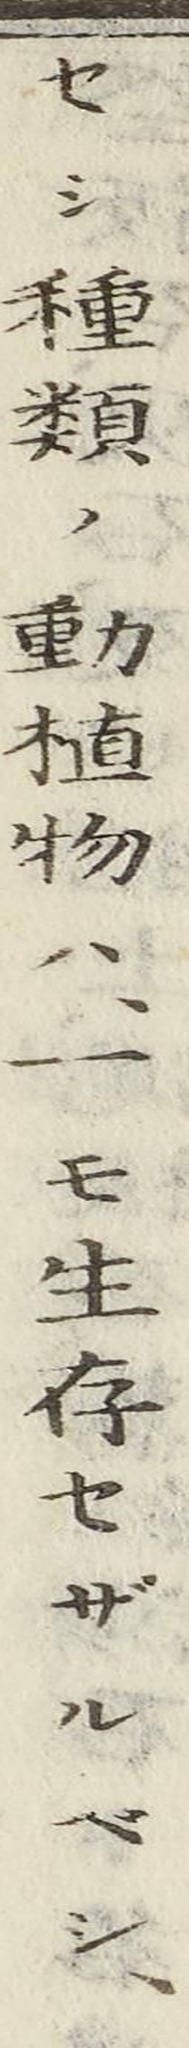セシ種類ノ動植物ハ、一モ生存セザルベシ、
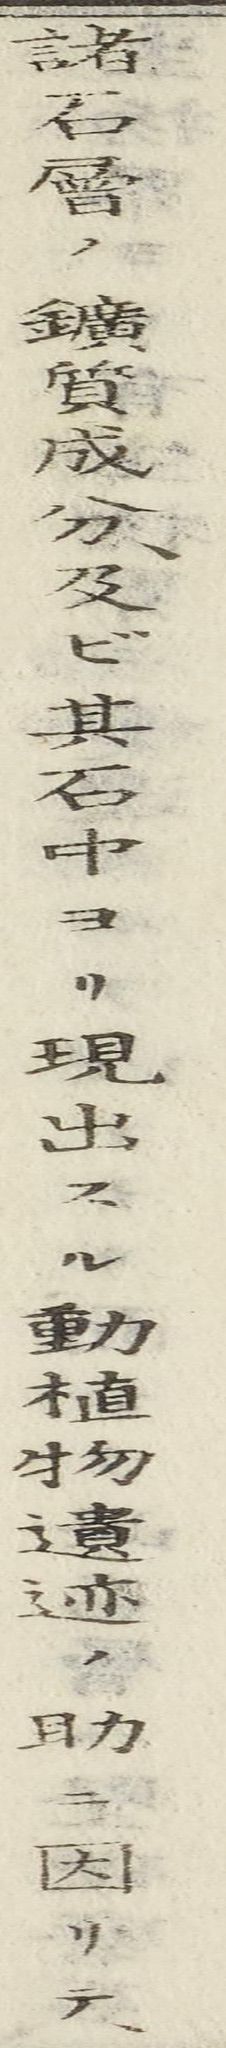諸石層ノ鉱質成分、及ビ其石中ヨリ現出スル動植物遺迹ノ助ニ因リテ、
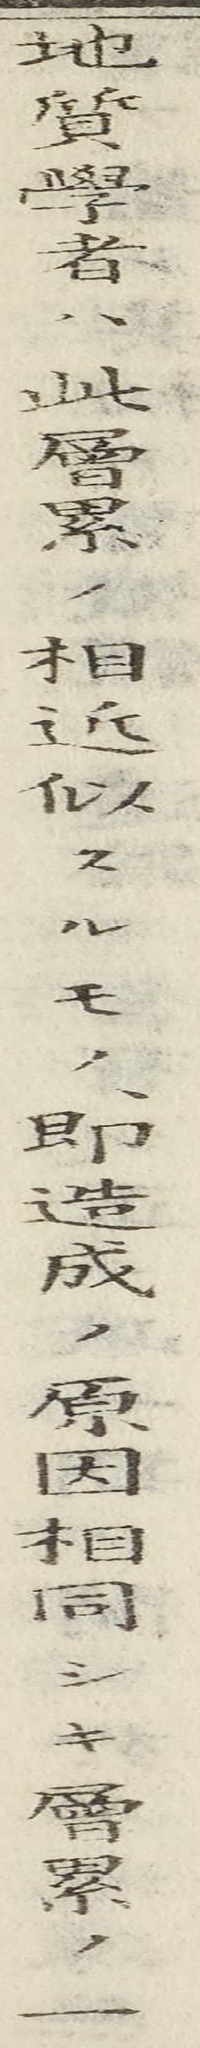地質学者ハ此層累ノ相近似スルモノ、即造成ノ原因相同シキ層累ノ一
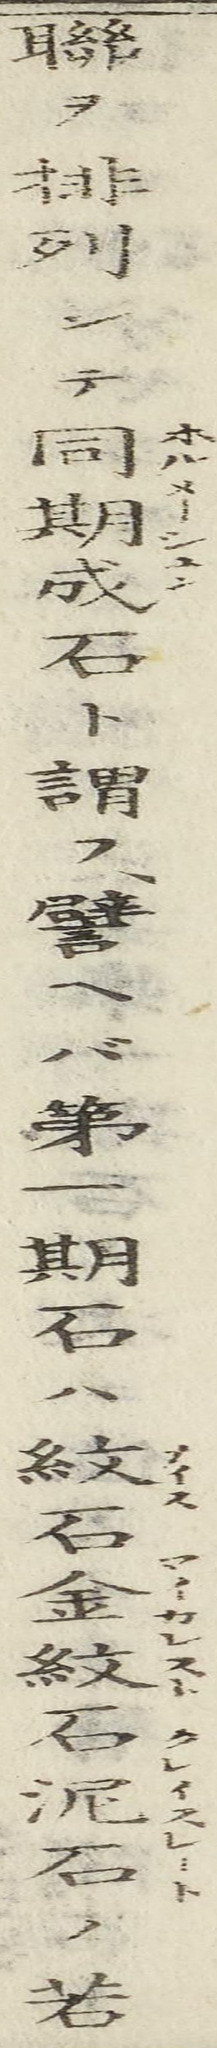連ヲ排列シテ同期成石ト謂フ、例ヘバ第一期石ハ紋石金紋石泥石ノ若
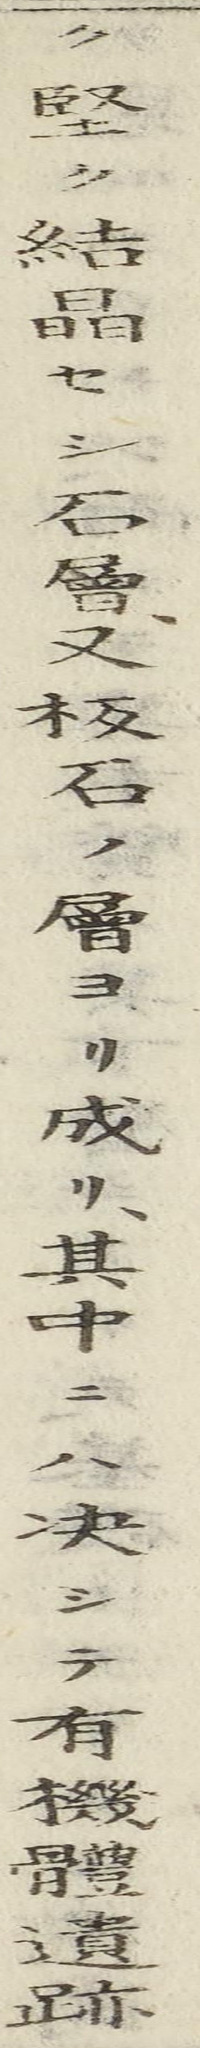ク堅ク結晶セシ石層、又板石ノ層ヨリ成リ、其中ニハ決シテ有機体遺跡

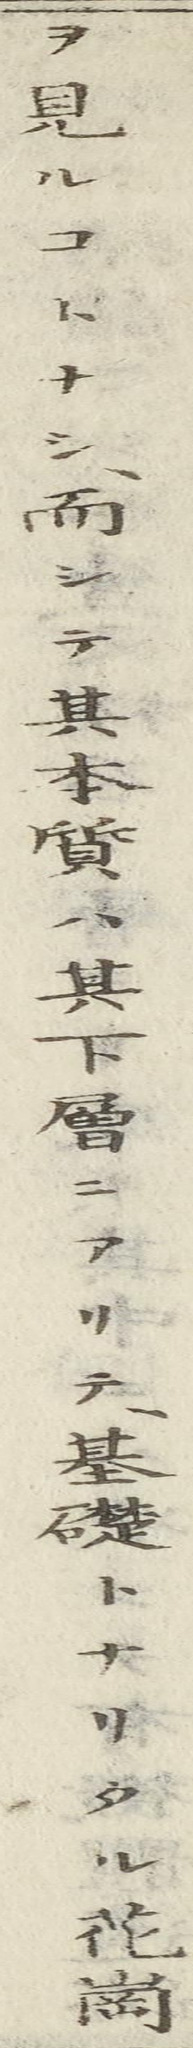ヲ見ルコトナシ、而シテ其本質ハ其下層ニアリテ、基礎トナリタル花崗
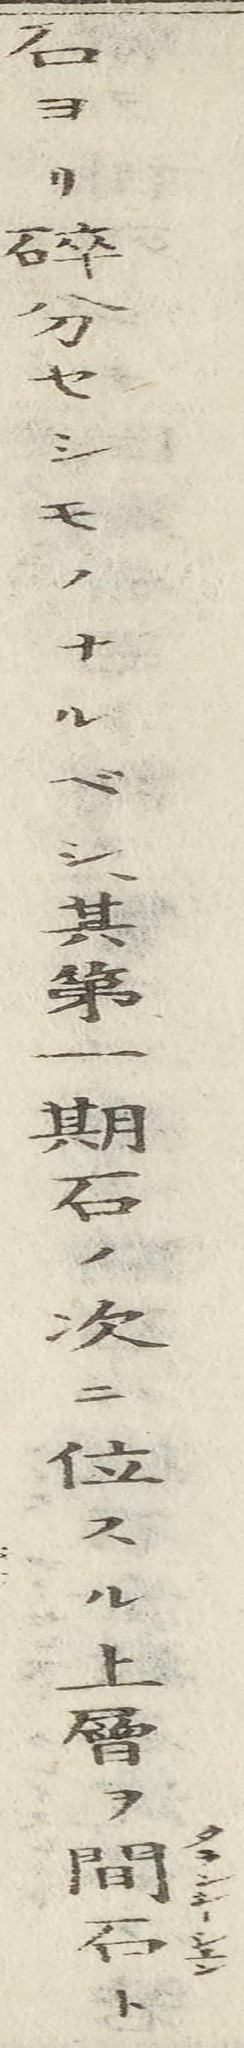石ヨリ砕分セシモノナルベシ、其第一期石ノ次ニ位スル上層ヲ間石ト
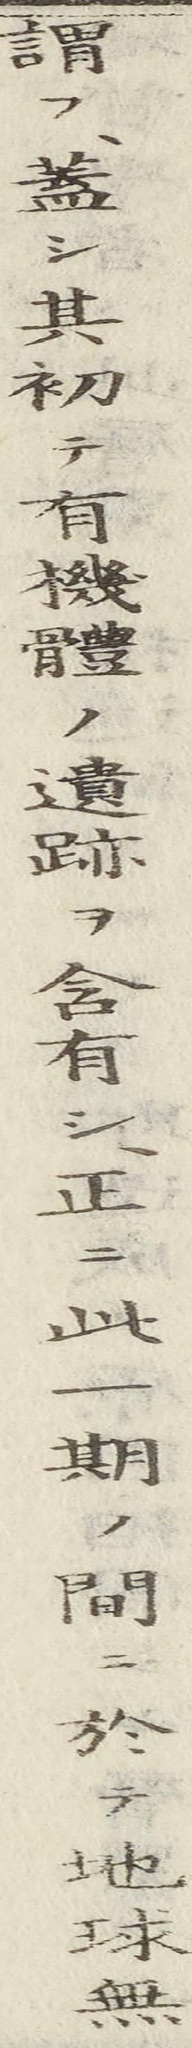謂フ、蓋シ其初テ有機体ノ遺跡ヲ含有シ、正ニ此一期ノ間ニ於テ地球無
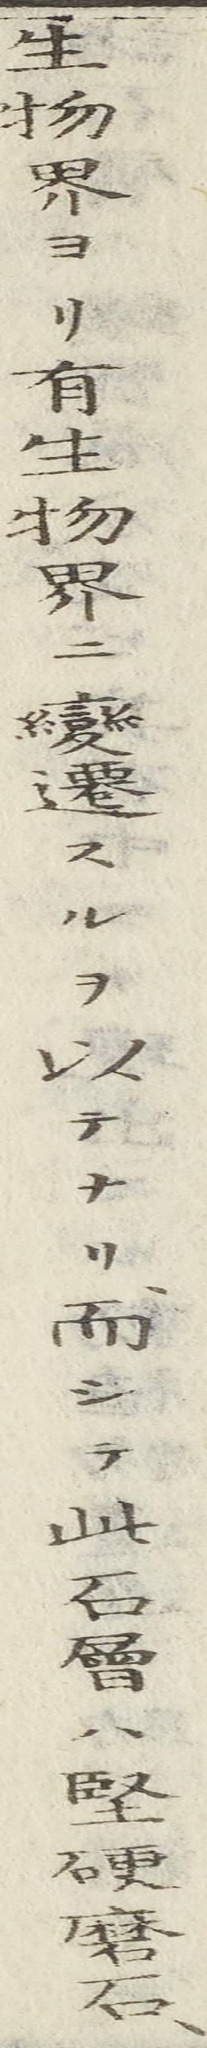生物界ヨリ有生物界ニ変遷スルヲ以テナリ、而シテ此石層ハ堅硬磨石、
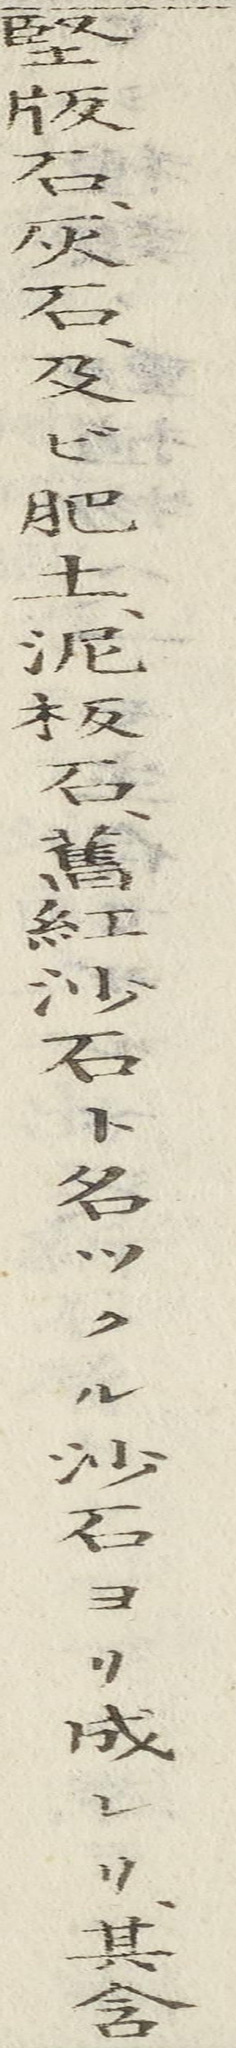堅版石、灰石、及ビ肥土、泥板石、旧紅沙石ト名ツクル沙石ヨリ成レリ、其含
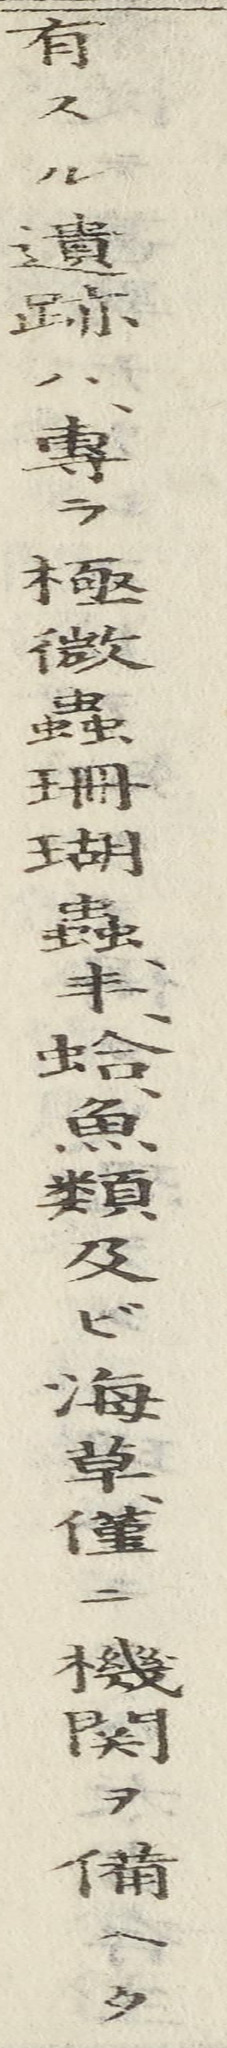有スル遺跡ハ、専ラ極微虫珊瑚虫、丰、蛤、魚類及ビ海草、僅ニ機関ヲ備ヘタ
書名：百科全書　地文學　全
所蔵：東京大学地震研究所図書室 Earthquake Research Institute Library, The University of Tokyo, JAPAN
